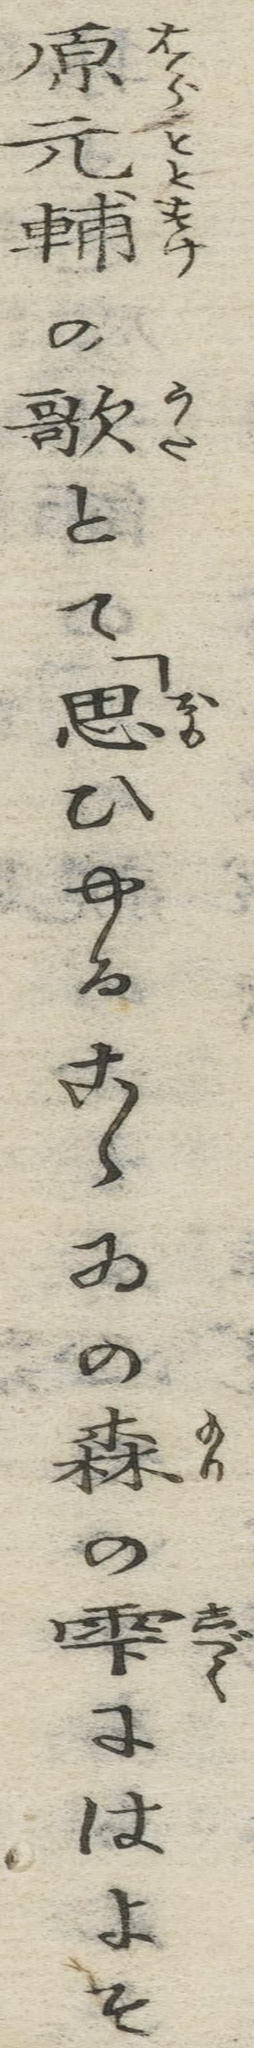原元輔の歌とて「思ひやるこゝゐの森の雫にはよそ
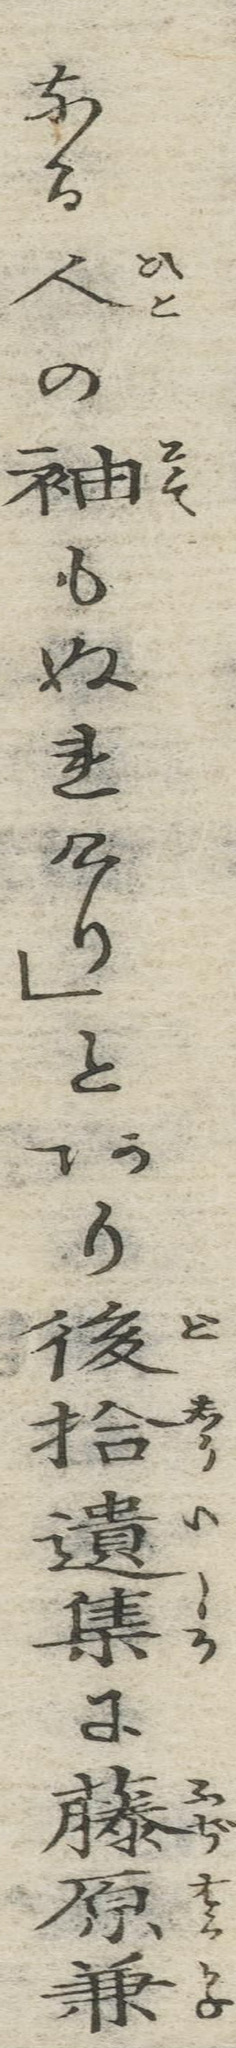なる人の袖もぬれけり」とあり後拾遺集に藤原兼
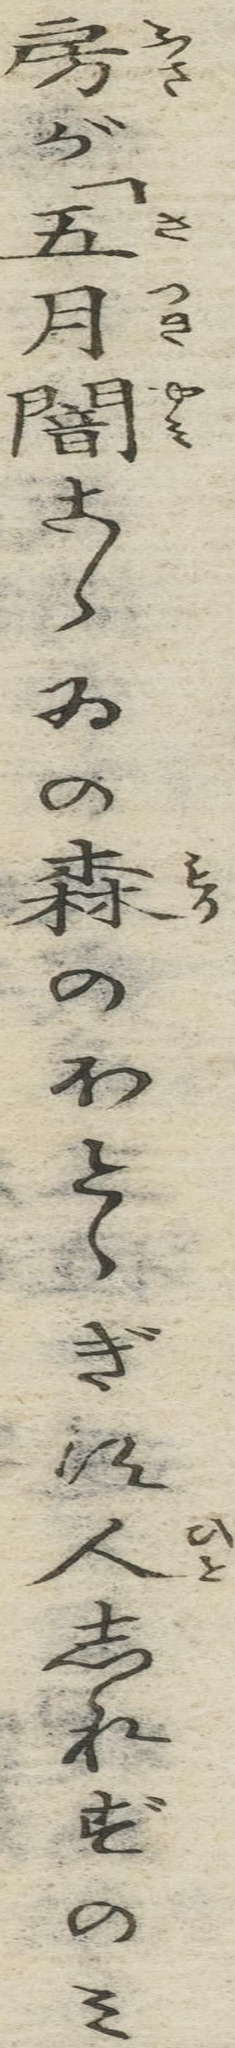房が「五月闇こゝゐの森のほとゝぎす人しれずのみ

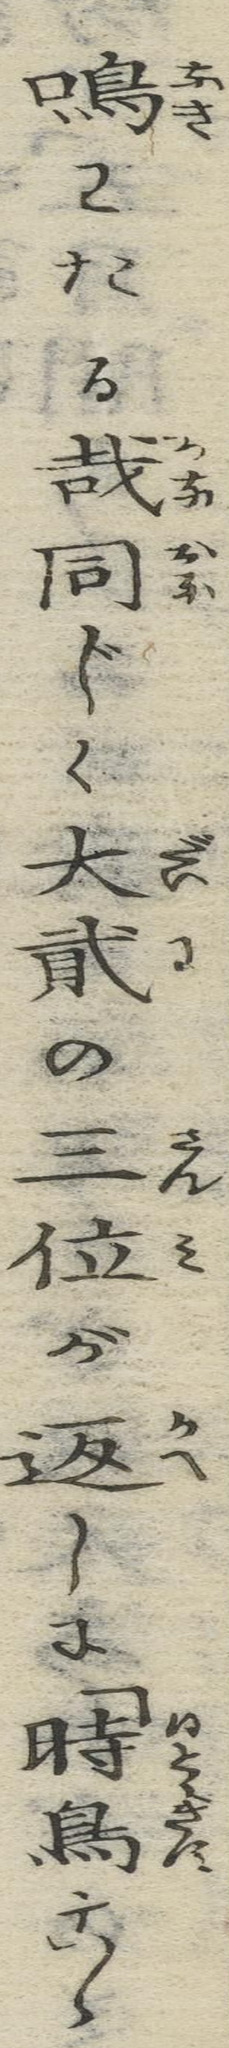鳴わたる哉同じく大貮の三位が返しに「時鳥こゝ
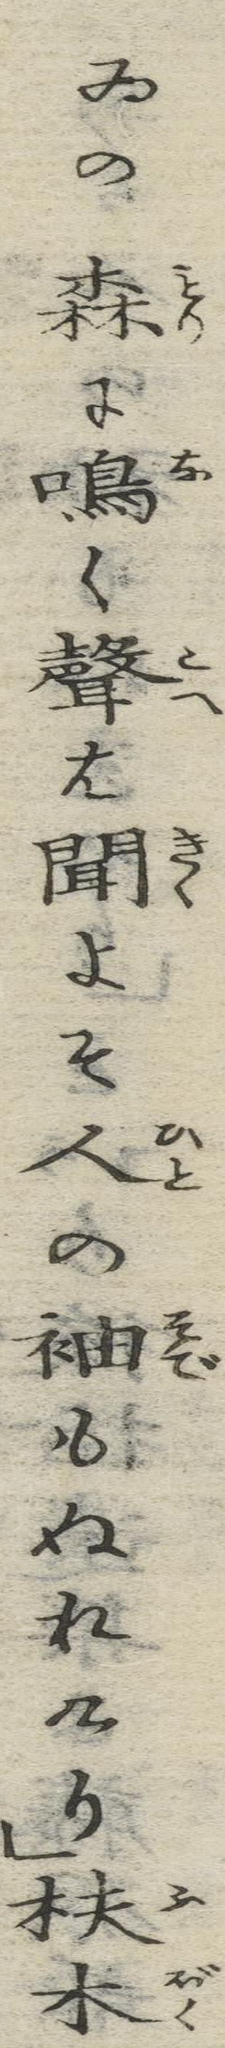ゐの森に鳴く声は聞よそ人の袖もぬれけり」枎木
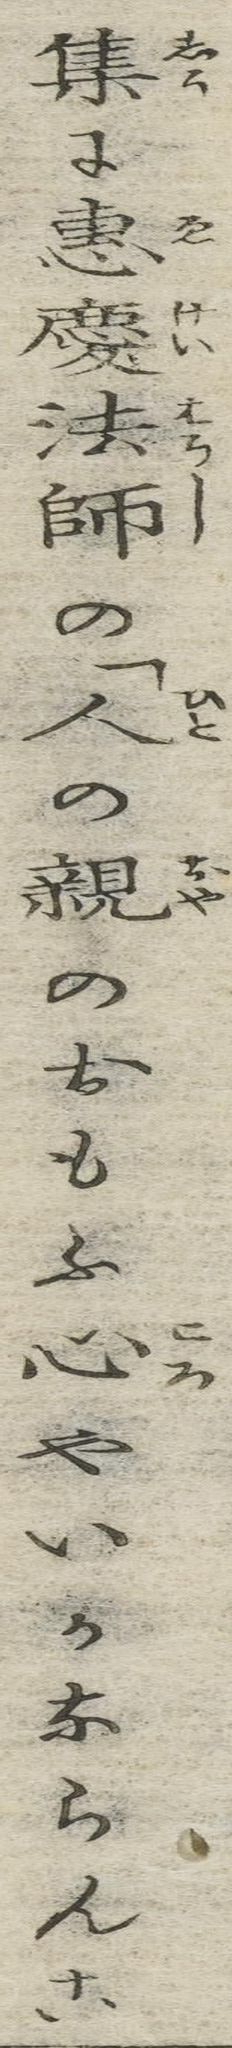集に恵慶法師の「人の親のおもふ心やいかならんこ
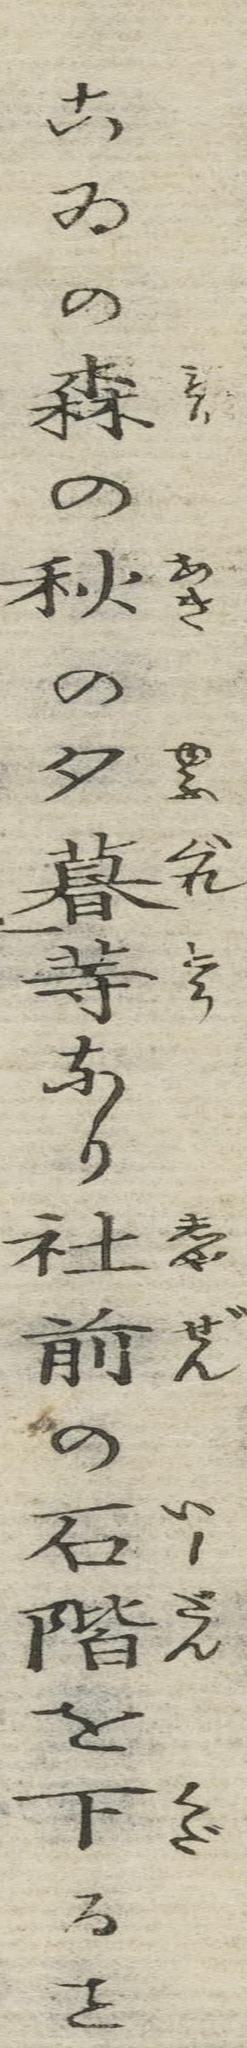こゐの森の秋の夕暮」等なり社前の石階を下ること
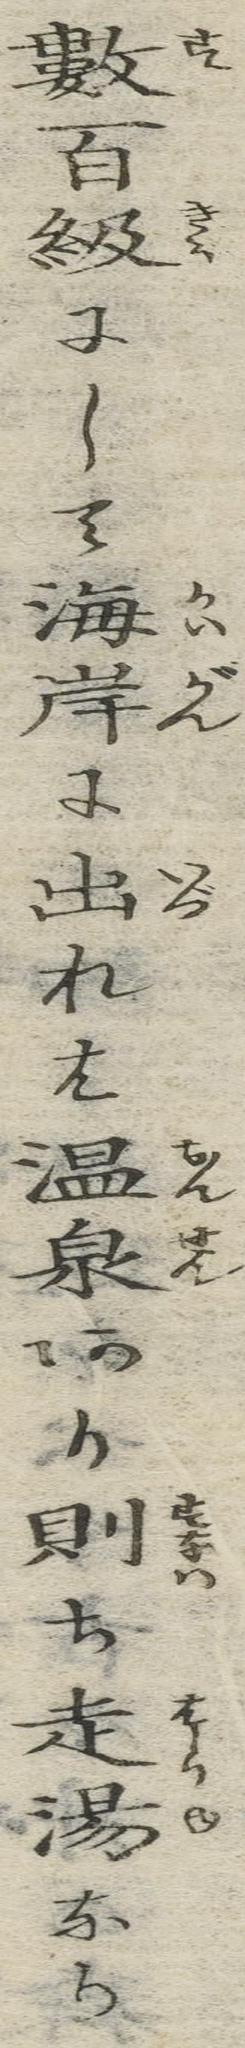数百級にして海岸に出れは温泉あり則ち走湯なり
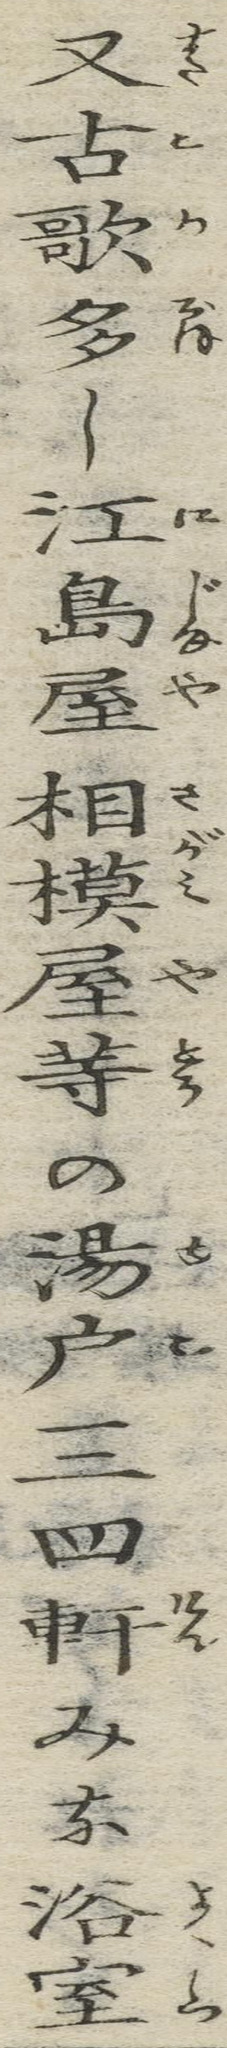又古歌多し江島屋相模屋等の湯戸三四軒みな浴室
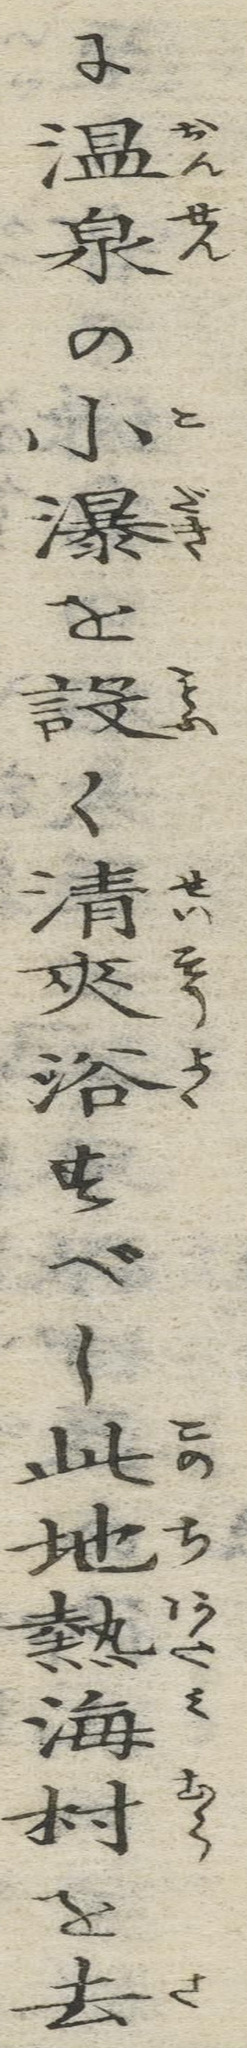に温泉の小瀑を設く清爽浴すべし此地熱海村を去
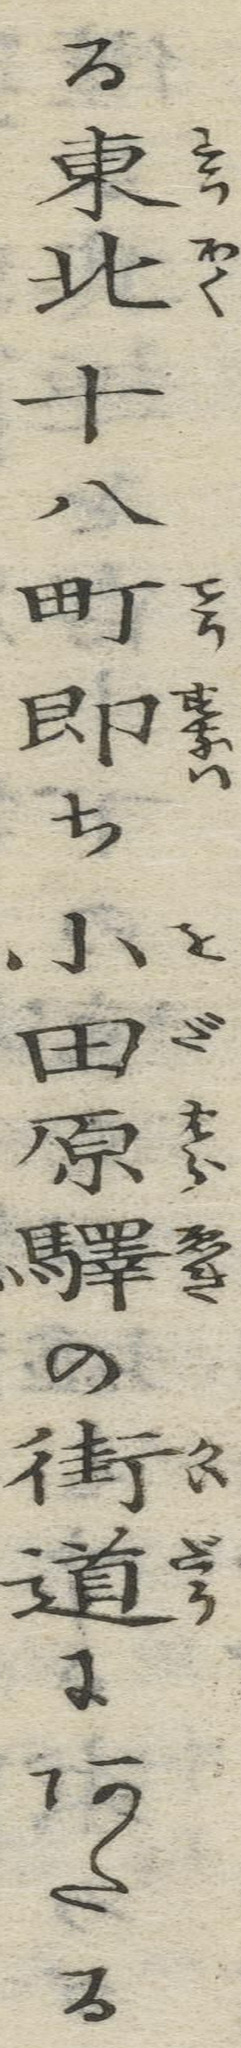る東北十八町即ち小田原駅の街道にあたる
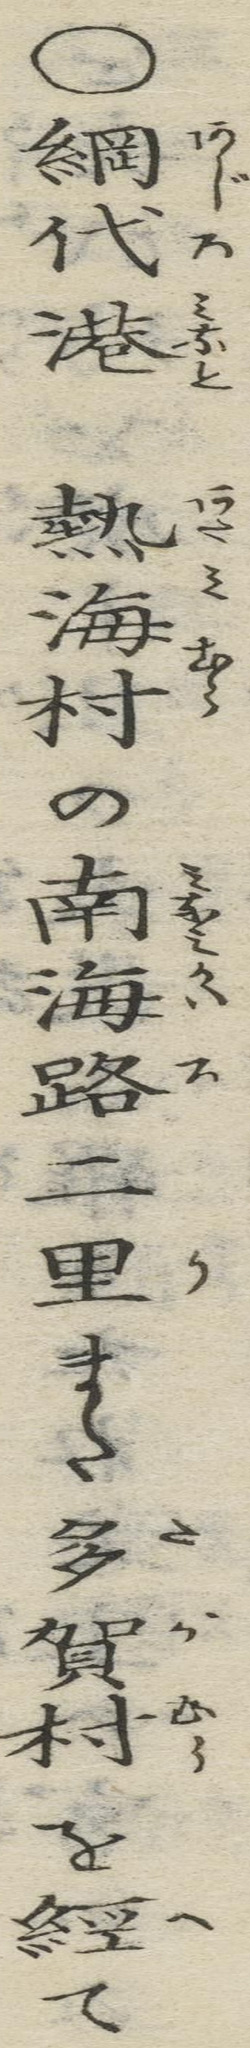○網代港熱海村の南海路二里また多賀村を経て
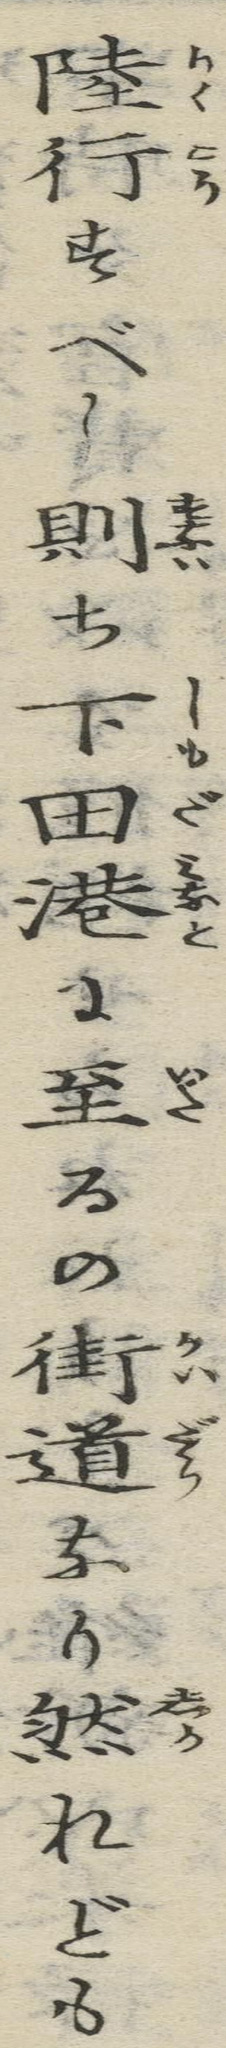陸行すべし則ち下田港に至るの街道なり然れども
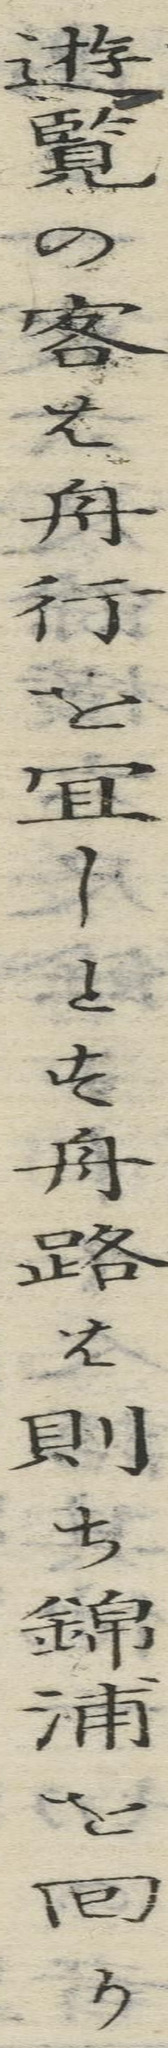遊覧の客は舟行を宜しとす舟路は則ち錦浦を囘り
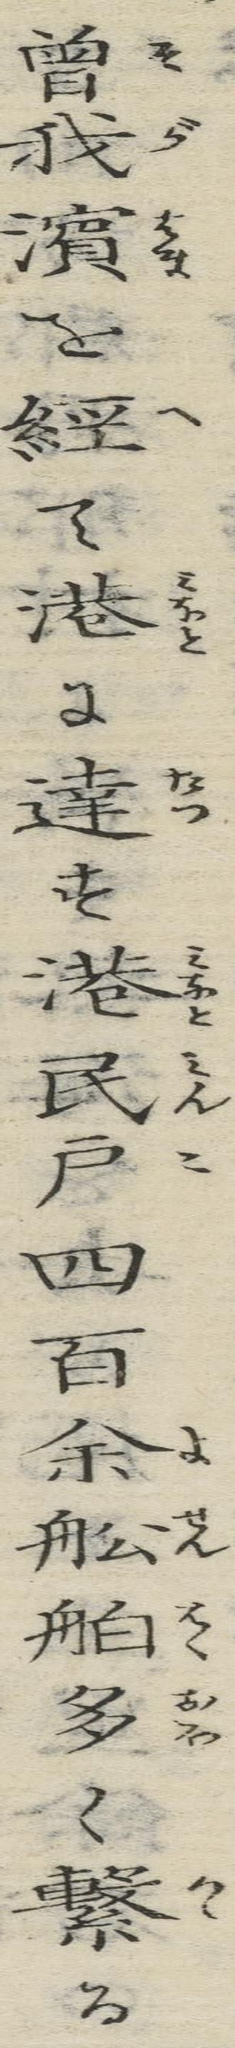曽我浜を経て港に達す港民戸四百余船舶多く繁る
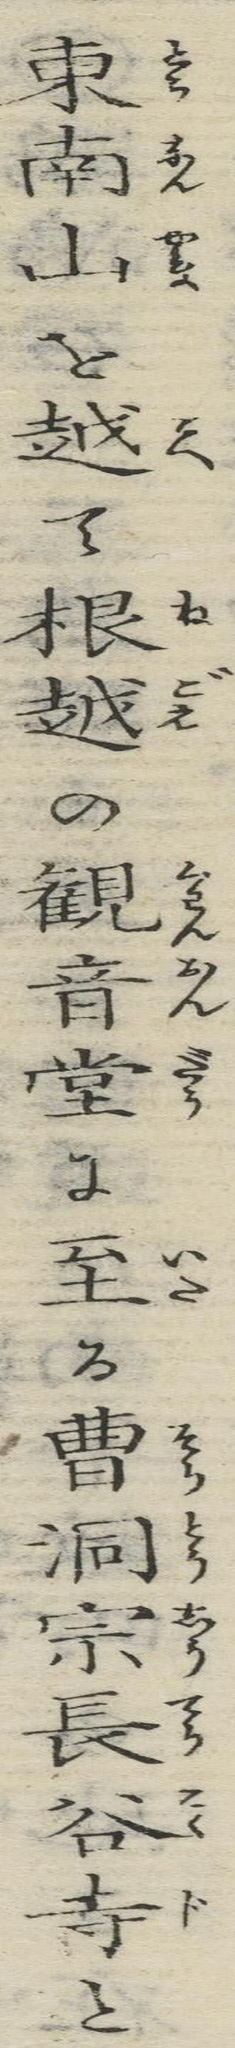東南山を越て根越の観音堂に至る曹洞宗長谷寺と
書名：豆州熱海誌　完
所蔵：東京大学地震研究所図書室 Earthquake Research Institute Library, The University of Tokyo, JAPAN
